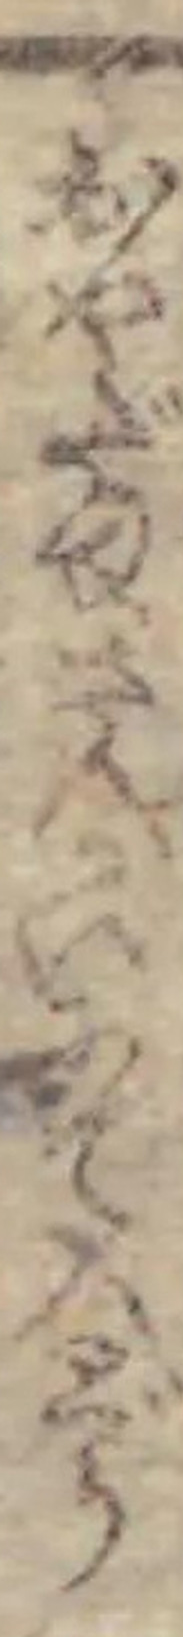おやだまさんがいにて入どう
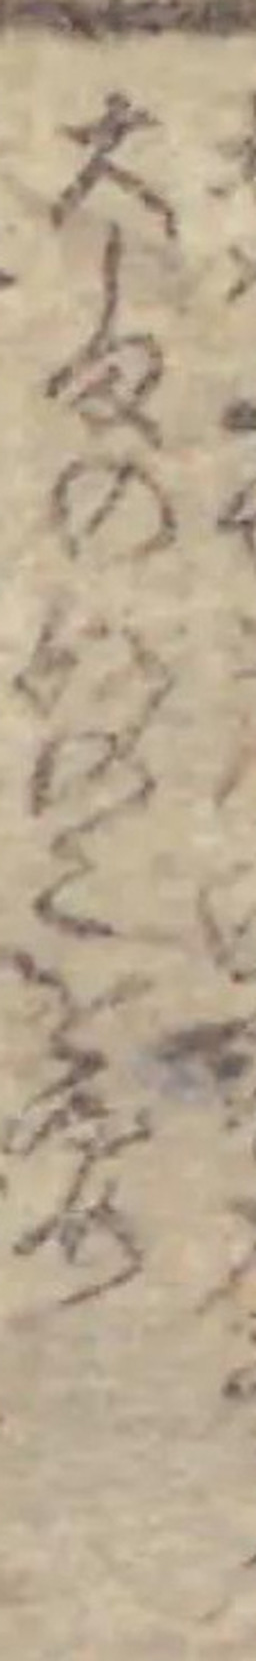大しまのぬのこをやめ
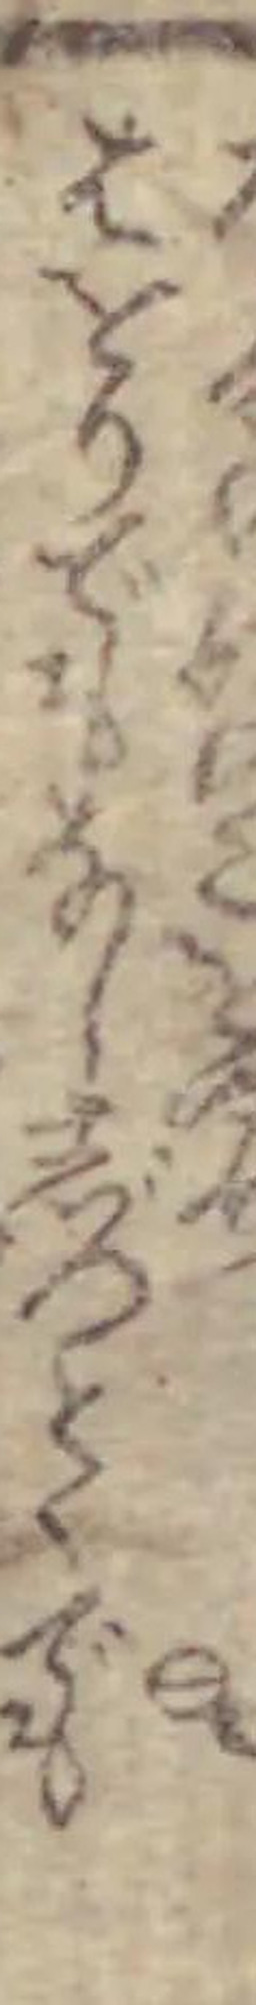はをりでもなしじつとくでも
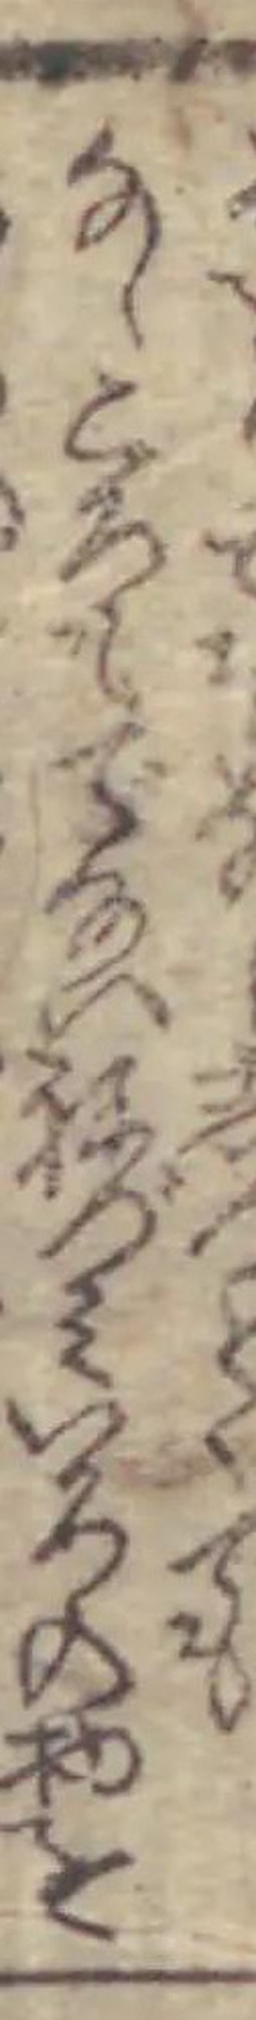なしころもでないねづみいろの物を
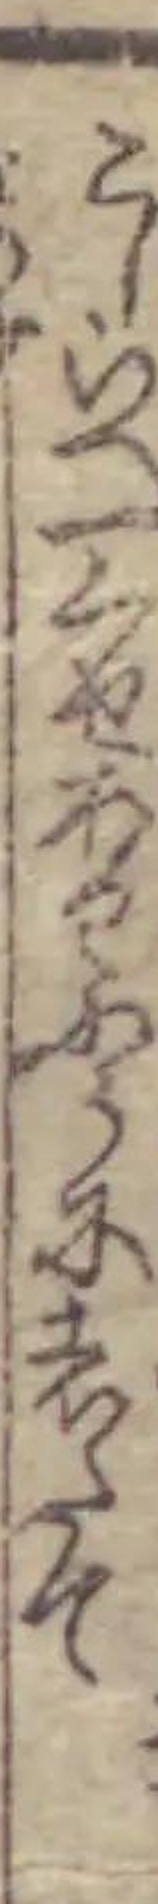こしらへ一くせあるふうにしたて
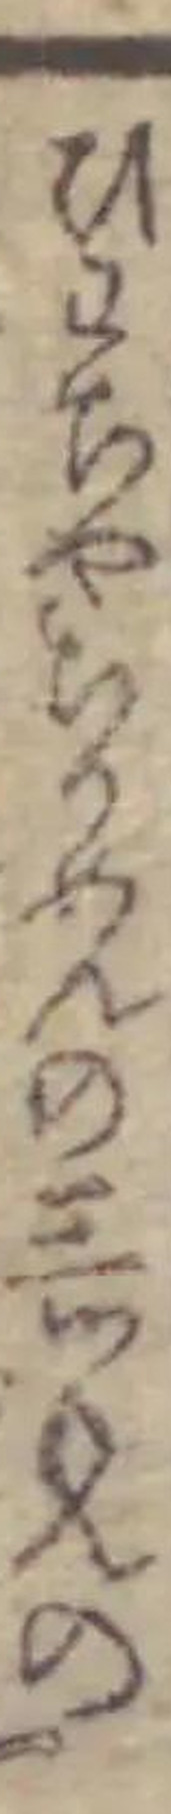ひわちやちりめんの三つもんの
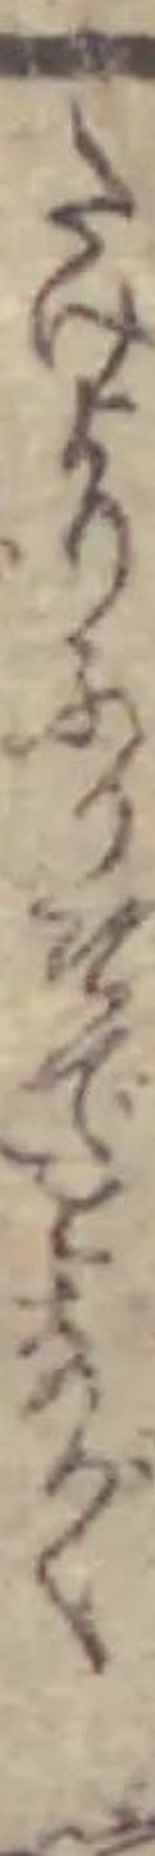たけよりふりそでをながく
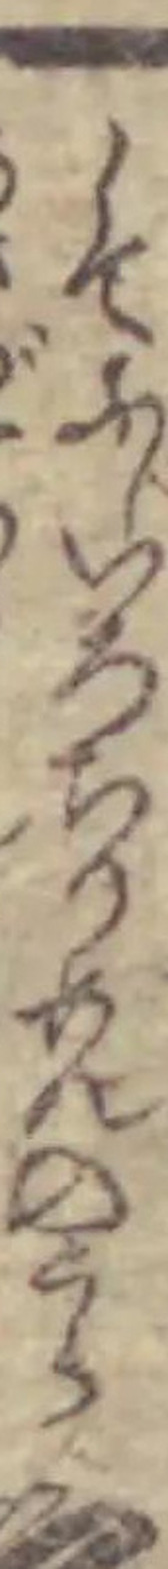してふじいろちりめんのうら
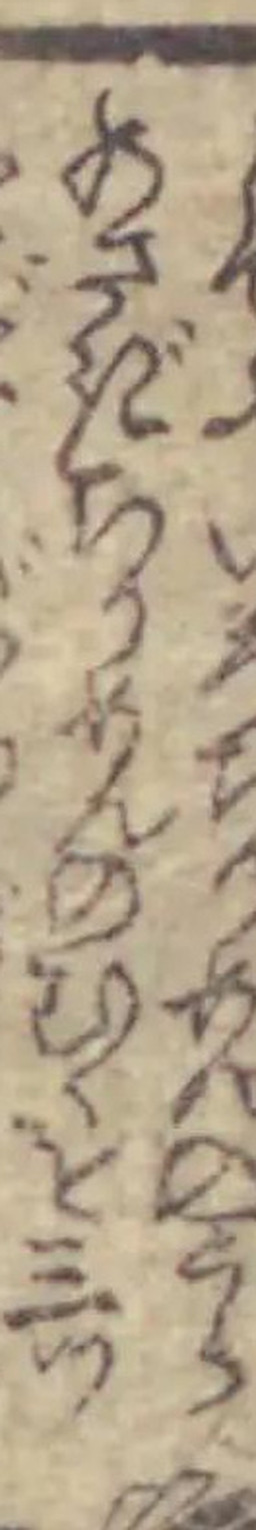あさぎちりめんのむくを三つ
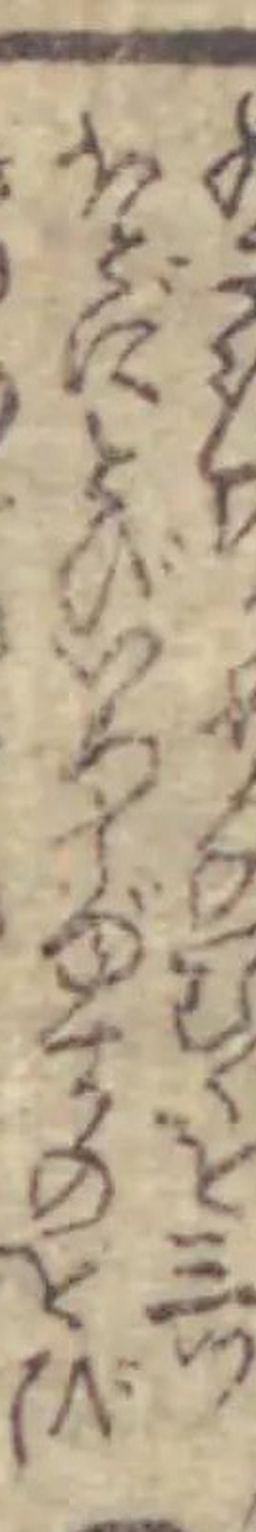ほどにとびいろじゆすのをび
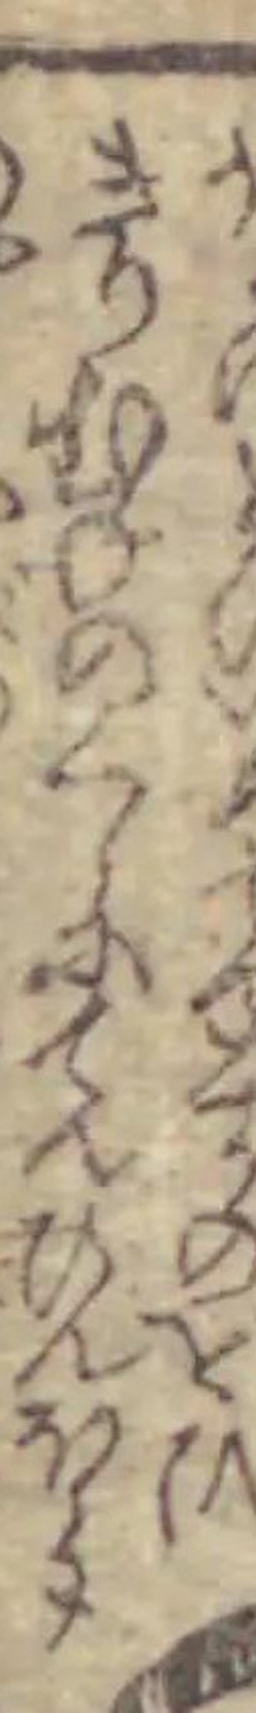きりむねのくしにてんひんほう
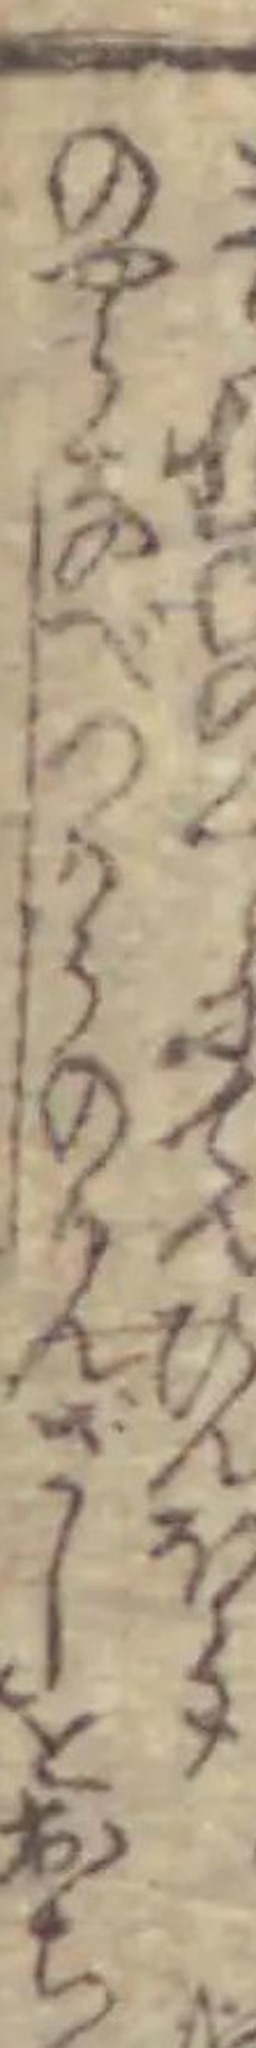のやうなべつかうのかんざしをおち
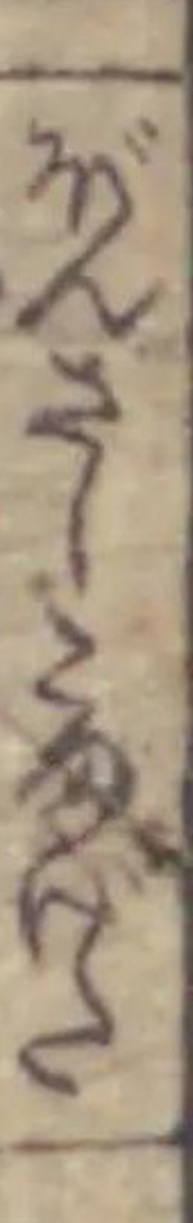ぼんさしこまげた
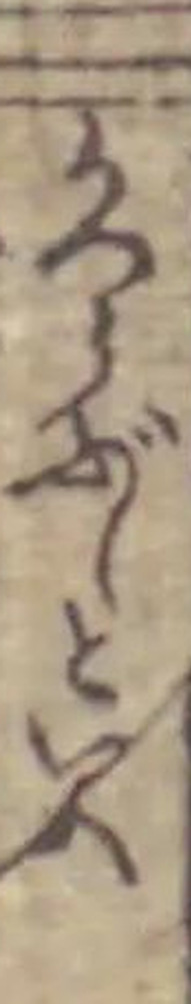かつらぶしといふ
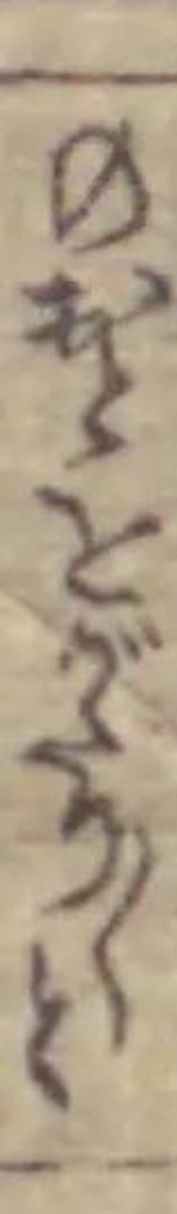のおとをがたり〳〵と
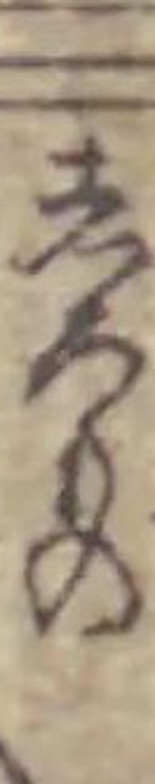しろもの
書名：化物昼寝鼾 2巻
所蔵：国立国会図書館 National Diet Library, JAPAN
